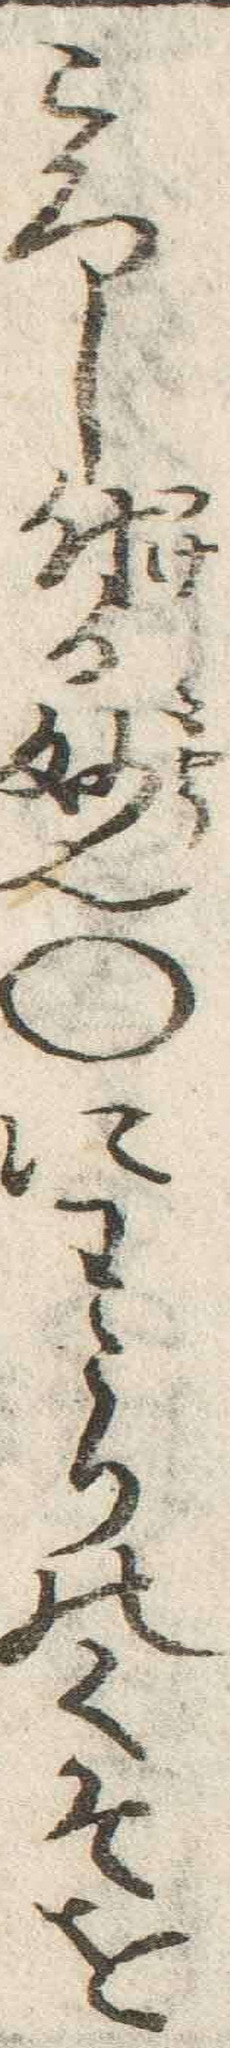ころし付る妙也○にわとりのくそを
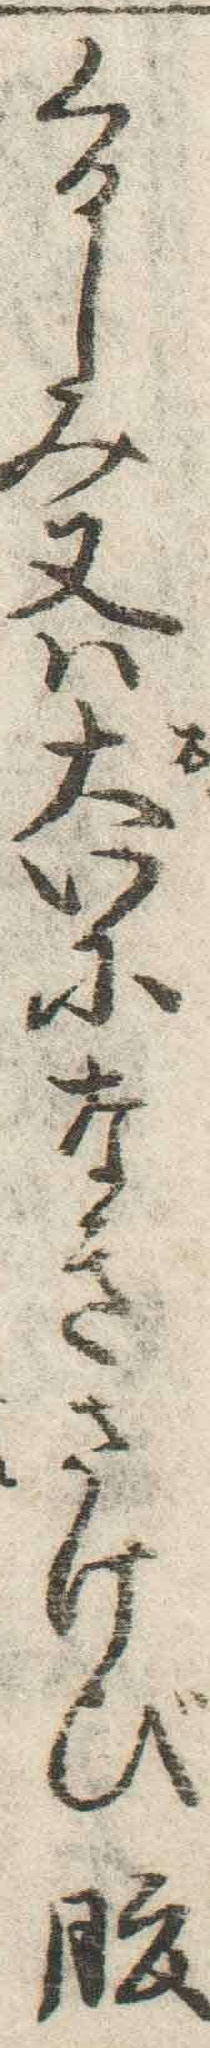くるしみ又は大いになきさけび腹
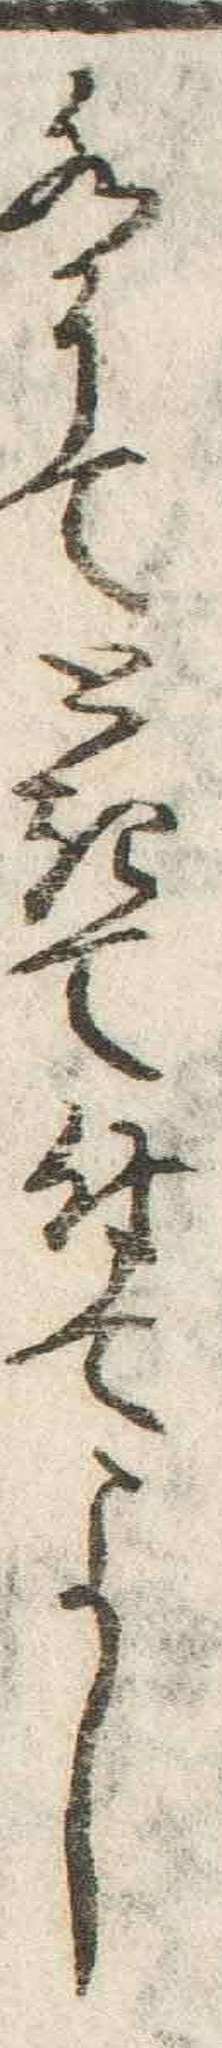水にてときて付てよし
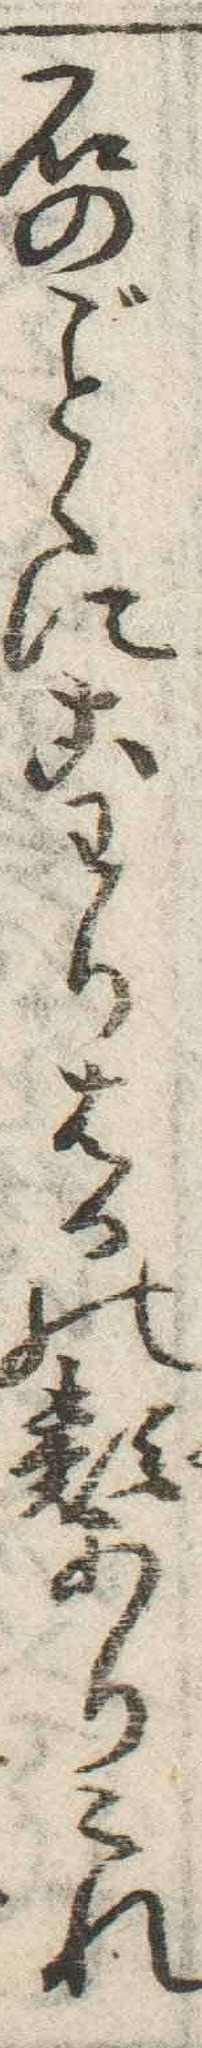石のごとくにこわりはるの類ありこれ
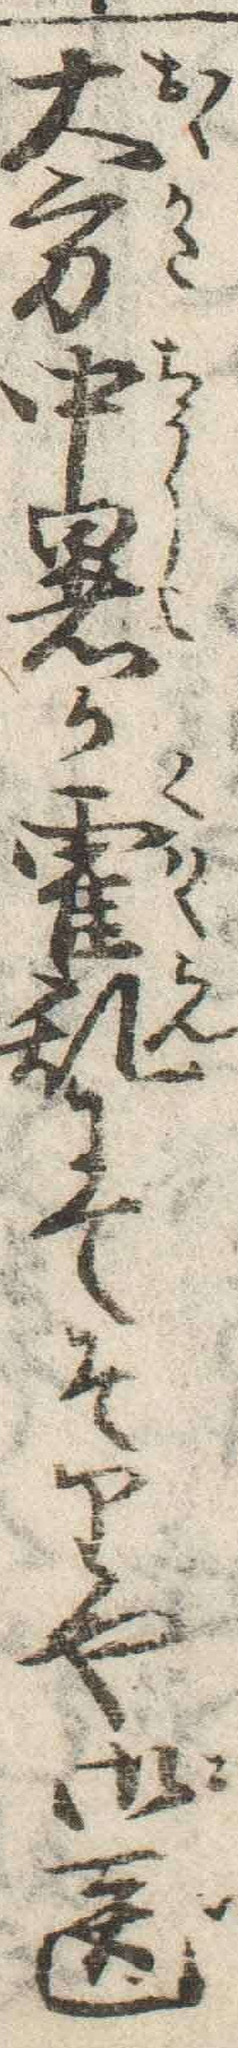大方中暑か霍乱にてそりや御医
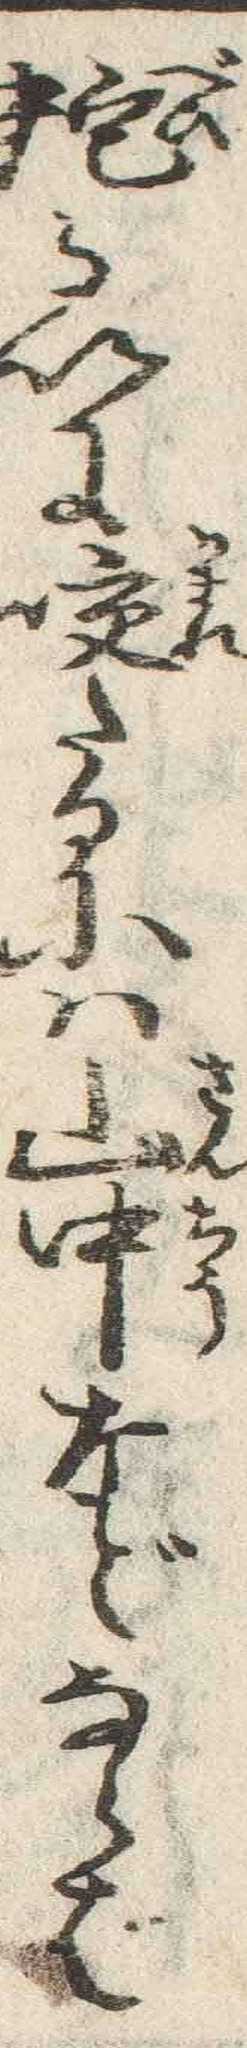蛇るいに咬たるには山中などならばへび
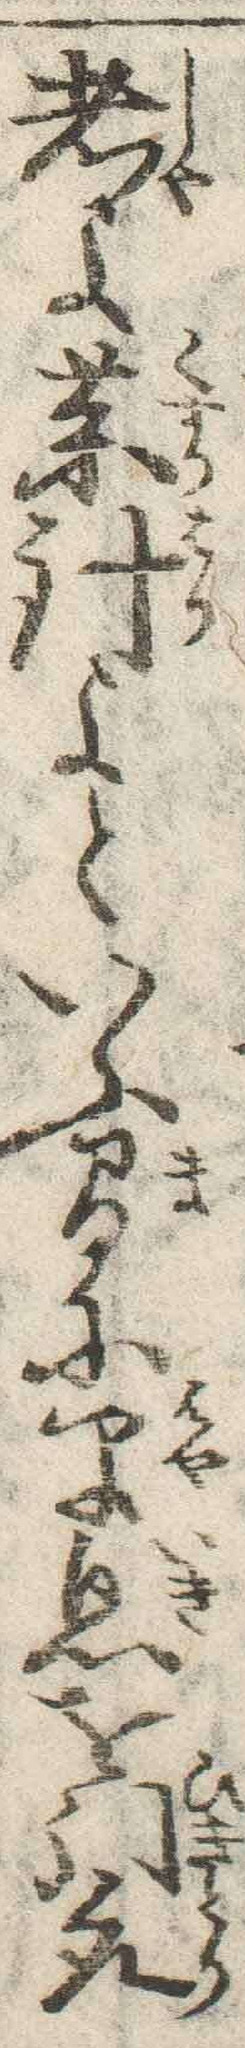者よ薬針よといふ間に早息を引取
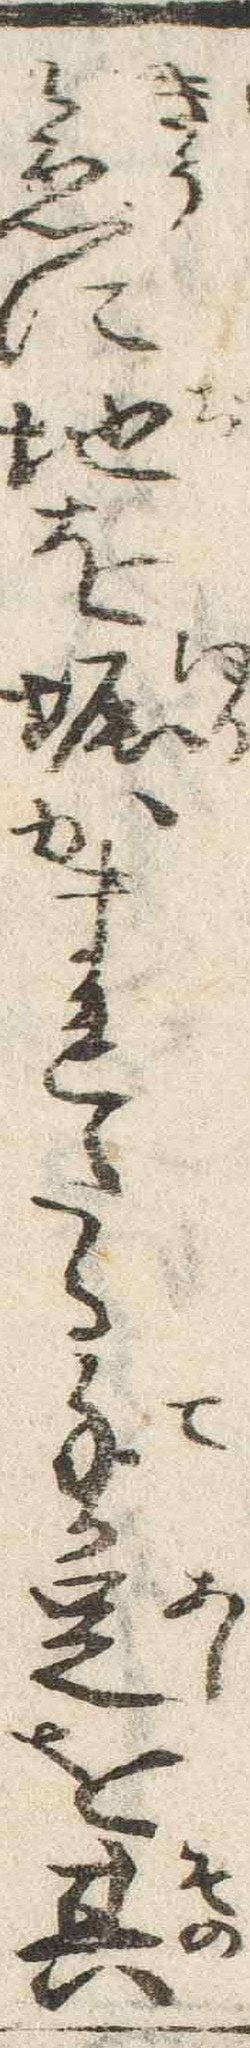急に地を堀かまれたる手か足を其
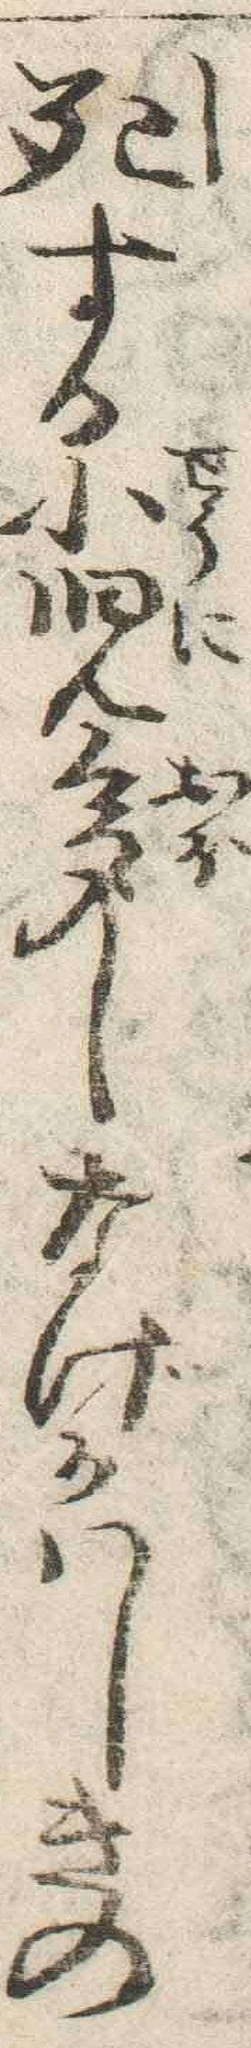死する小児多しなげかはしきの
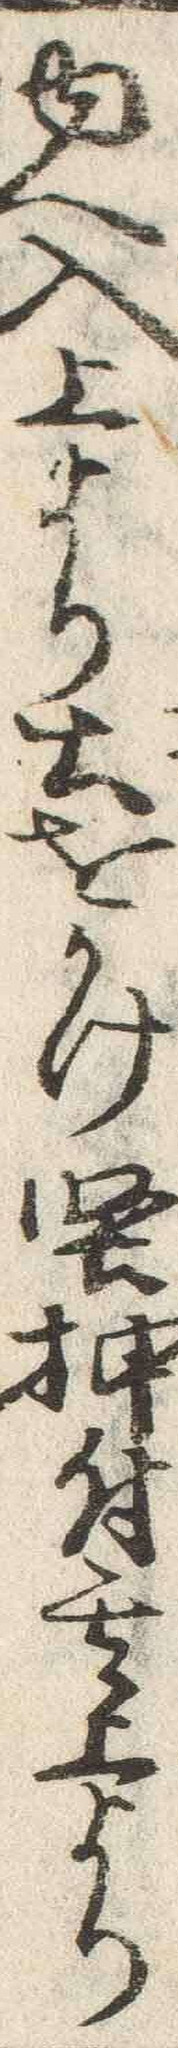内へ入上より土をかけ堅押付其上より
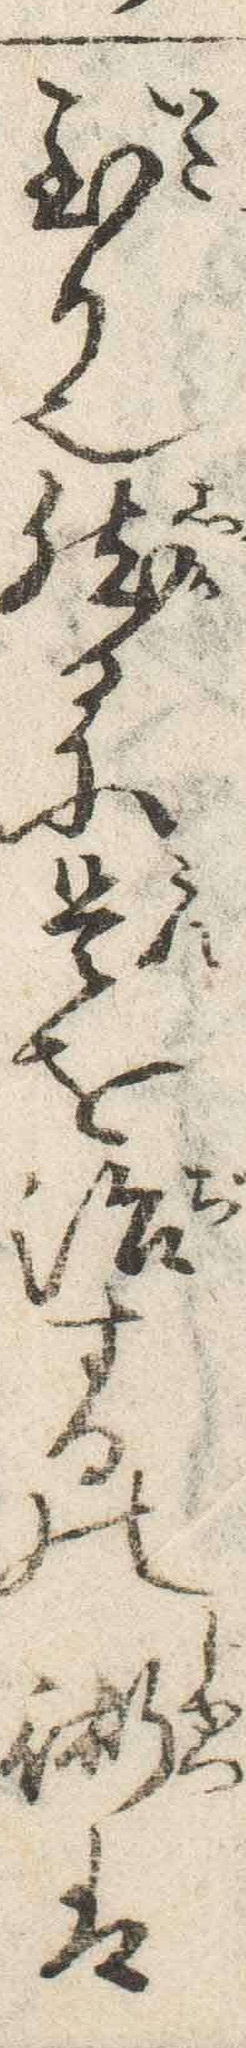至り也然るに是を治するの術は
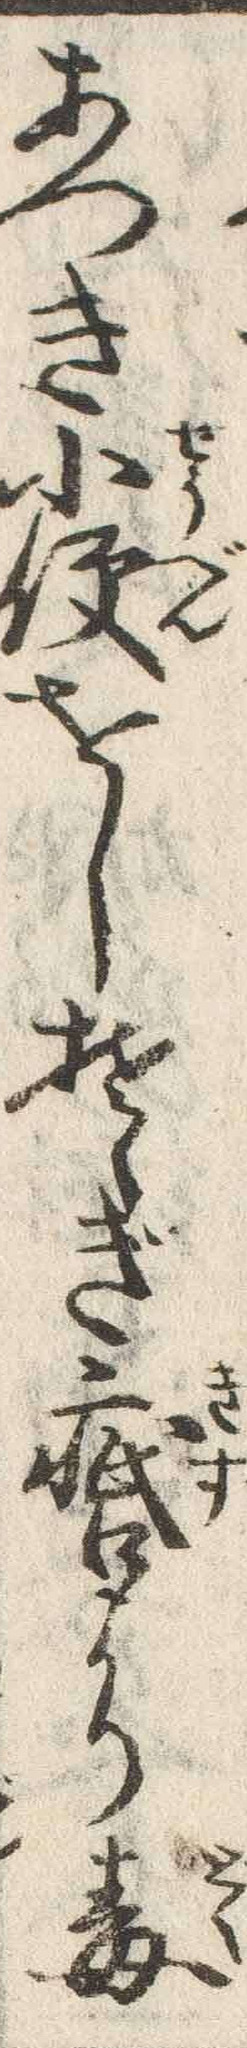あつき小便をしそゝぎ疵口より毒
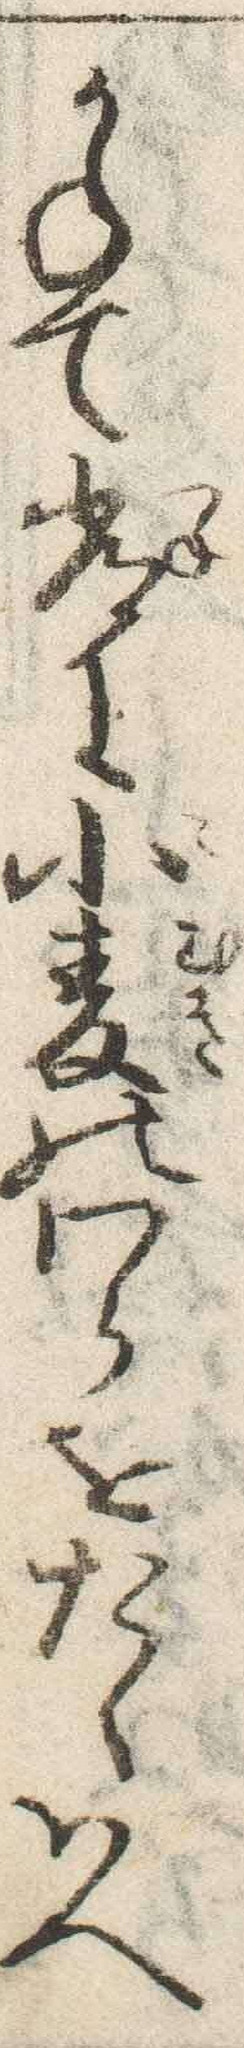かねて常に小麦のわらをたくわへ
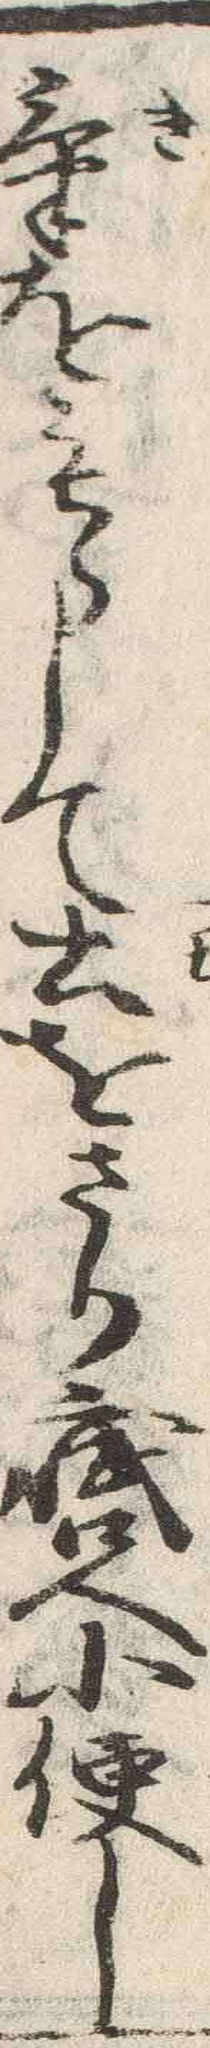気をもらして土をさり疵口へ小便し
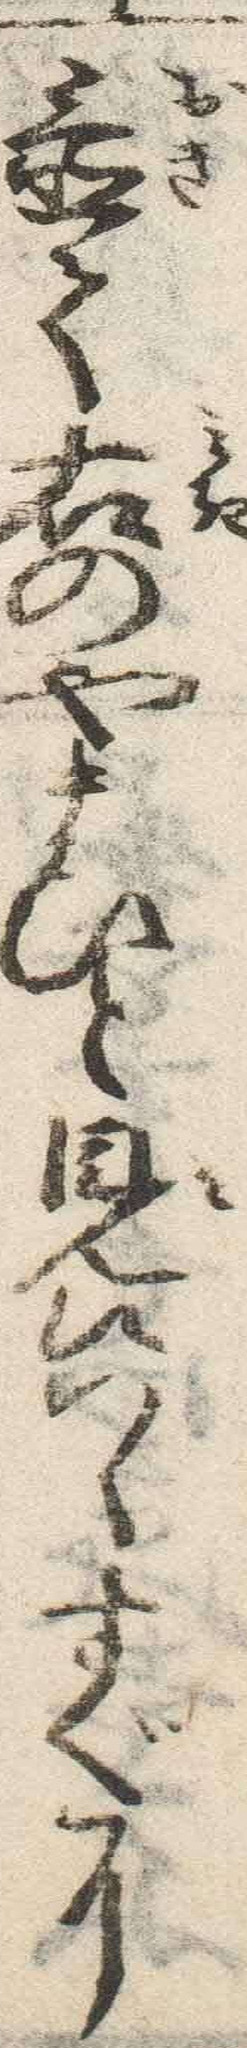置て右のやまひと見候はゝすぐに
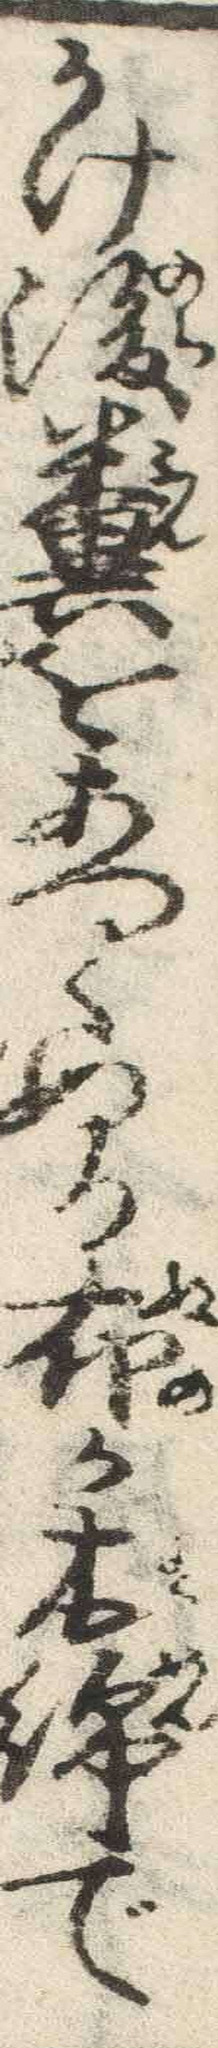かけ後糞をあつくぬり布か木綿で
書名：撫育草
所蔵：東京学芸大学附属図書館 国文学研究資料館
